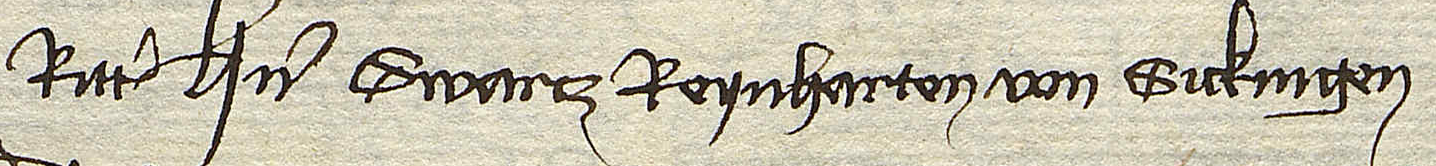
Ritt* Hn* Swarcʒ Reynharten von Sicknigen
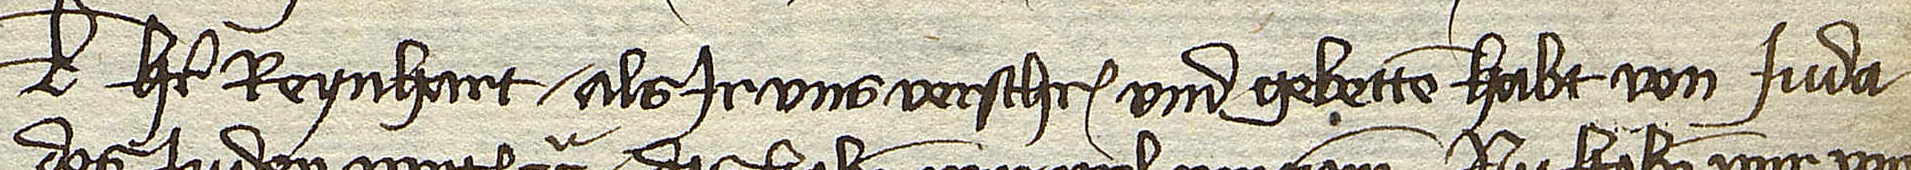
L* Hr* Reynhart / als Ir vns verſchr* vnd gebette* habt von Iuda
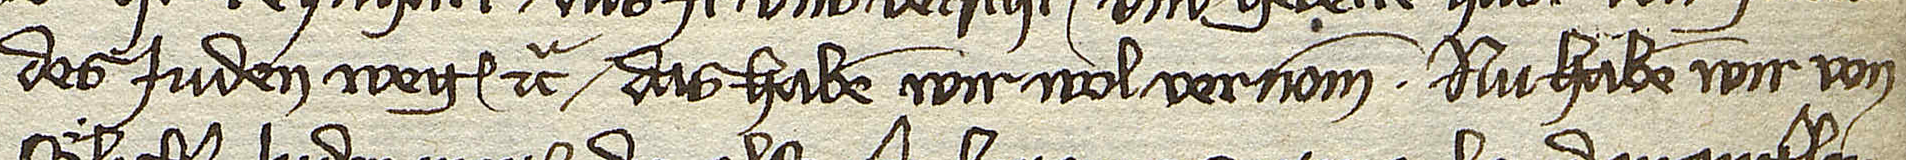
des Iuden weg* ec* / das habe* wir wol vernom* . Nu habe* wir von
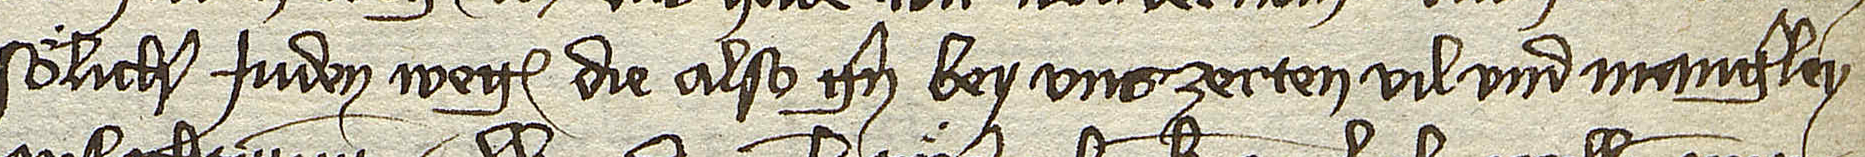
ſölich* Iuden weg* die alſo gn* bey vns ʒerten vnd mang*ley
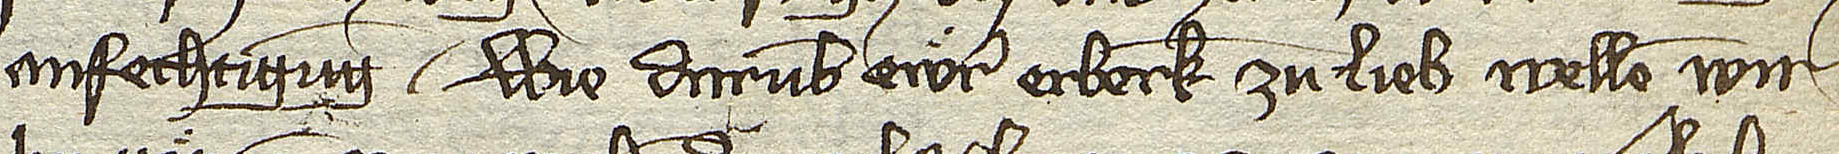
anfechtigug* / Wie darub* ewr* erberk* ʒu lieb welle* wir
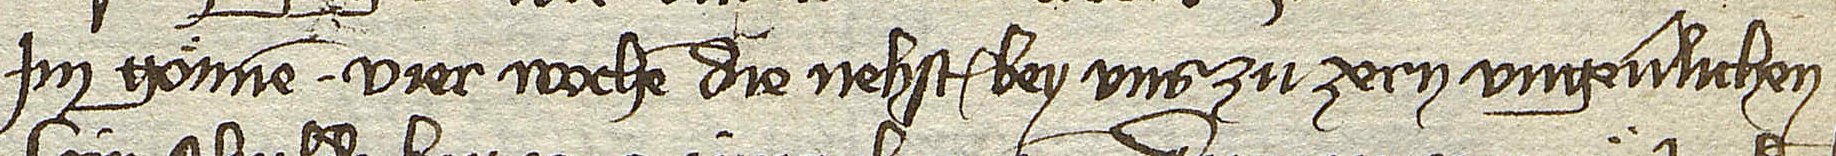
Im gönne* . vier woche* die nehſte* bey vns ʒu ʒern vngeu*lichen
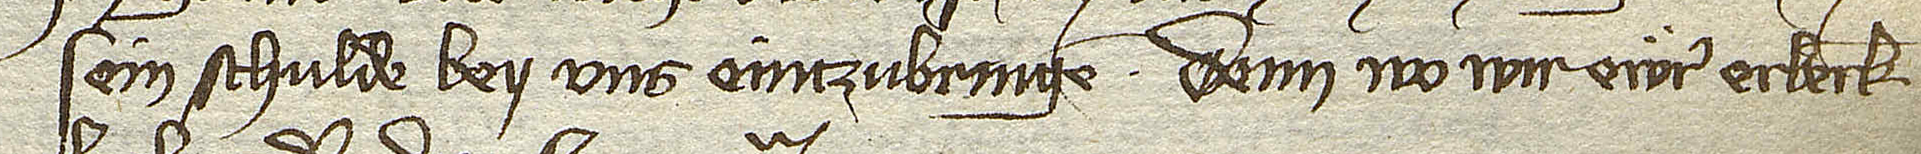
ſein ſchulde bey vns eincʒubringe* . Denn wo wir ewr* erberk*
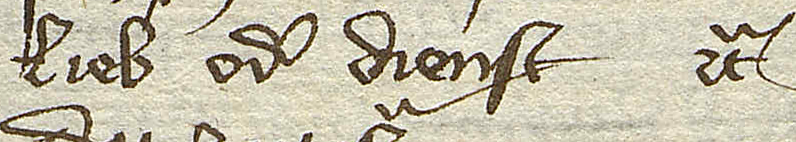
lieb od* dienſt ec*
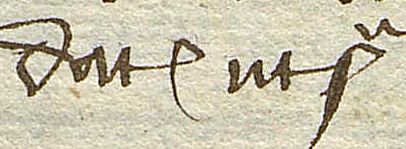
Dat* ut ſ*
